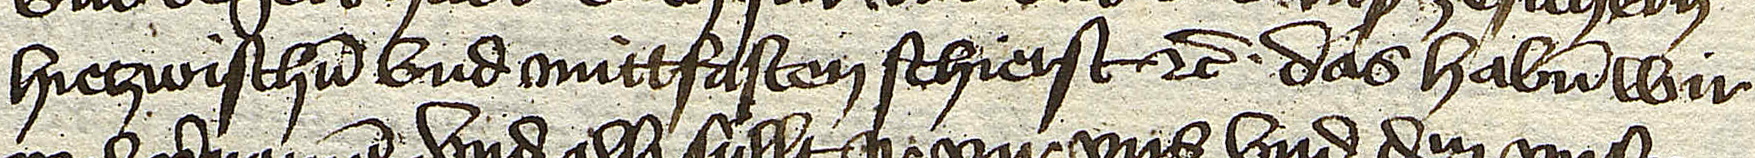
hiecʒwiſch* vnd mittfaſten ſchierſt ec* . das hab*n wir
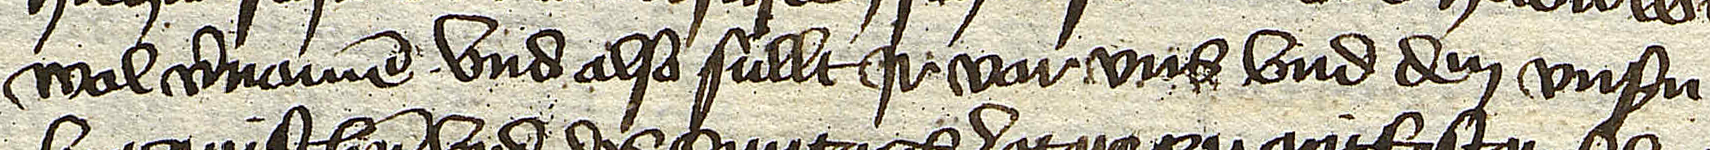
wol v*nome* . Vnd alſo ſüllt Ir vor vns vnd den vnſ*n
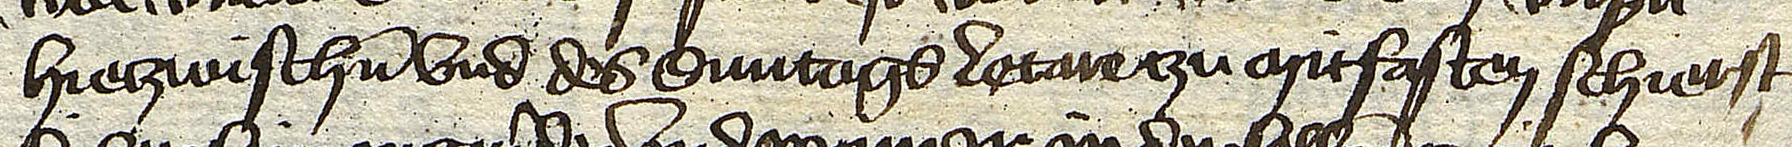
hiecʒwiſch*n vnd des Suntags Letare cʒu Mitfaſten ſchierſt
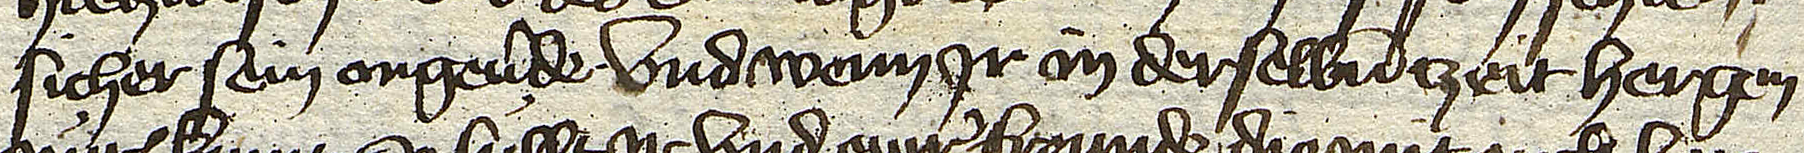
ſicher ſein on geu*de . Vnd wenn Ir in derſelb*n cʒeit her gen
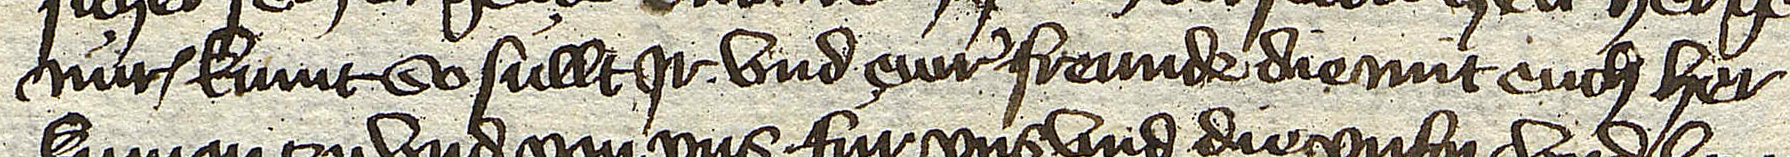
nür* kumt So ſüllt Ir . Vnd ewr freunde die mit euch her
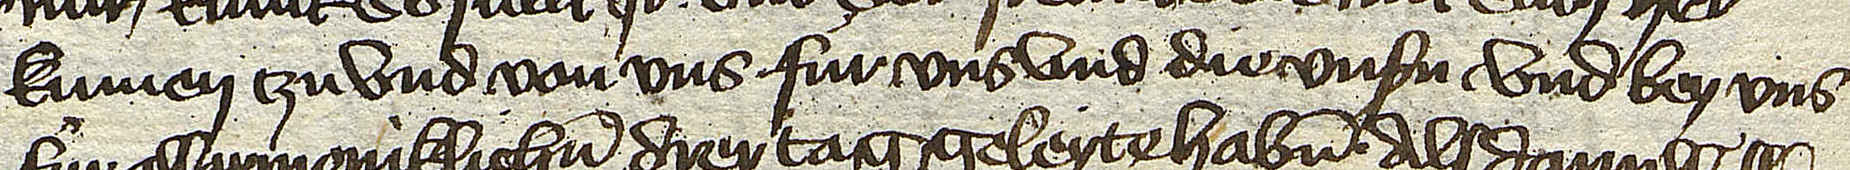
kumen cʒu Vnd von vns für vns vnd die vnſ*n / vnd bey vns
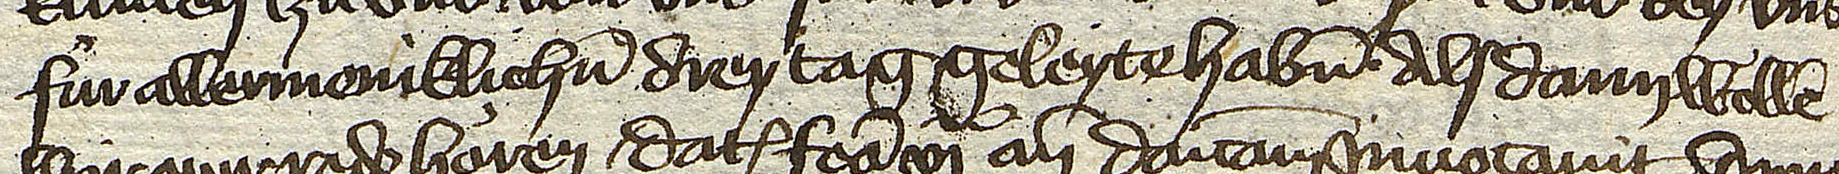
für allermeniklich*n drey tag geleyte hab*n . Alſdann wölle*
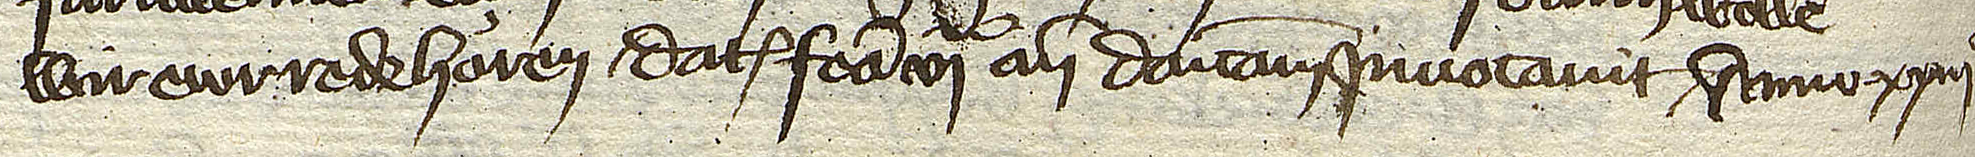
Wir ewr rede hören / Dat* fe*a vi* an* doicam* Inuocauit / Anno xxiii*
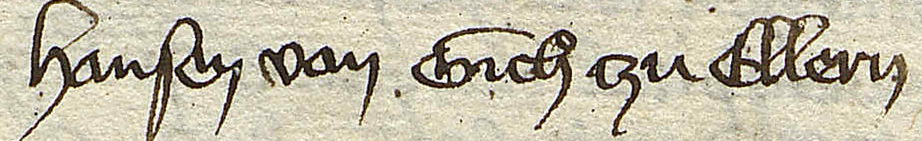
hanſen von Gich cʒu Ellern
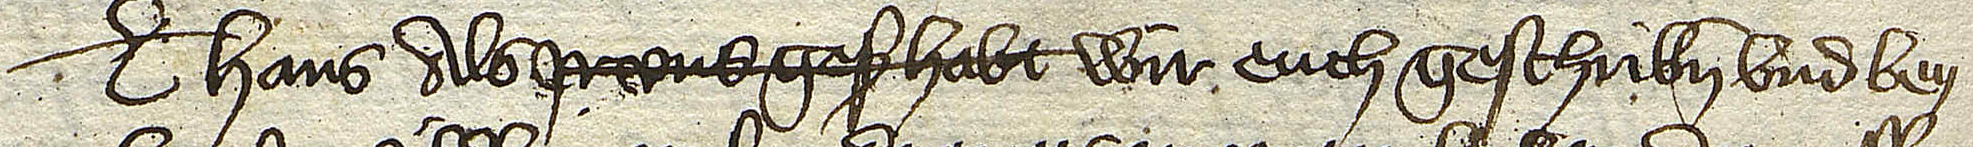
L* hans Als Ir vns geſ* habt wir euch geſchrib*n vnd bey
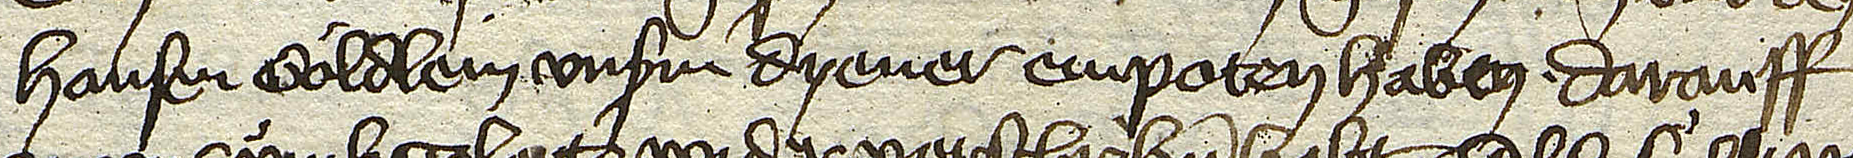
hanſen Göldlein vnſ*m dyener empoten haben . Darauff
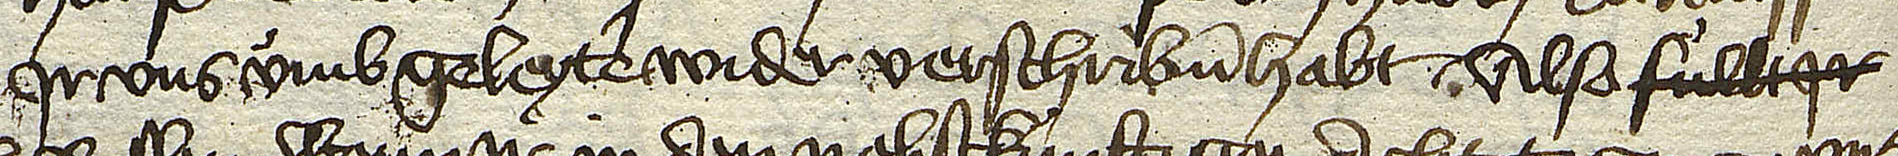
Ir vns v̈mb geleyte wider verſchrib*n habt / Alſo ſüllt Ir
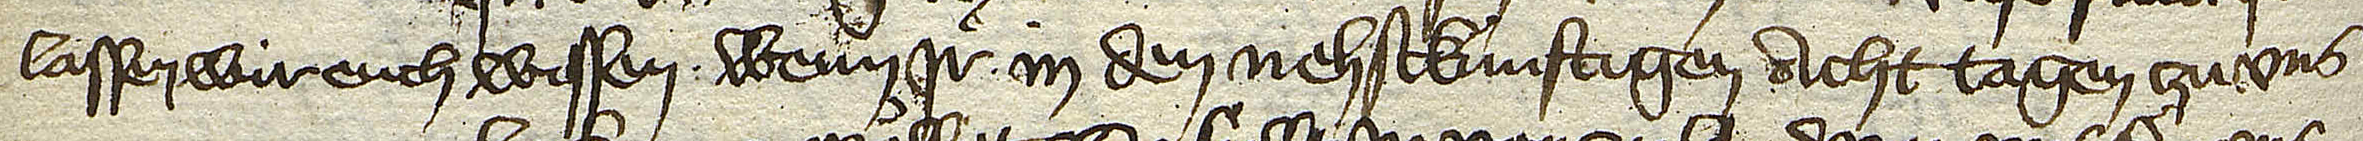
laſſen wir euch wiſſen . wenn Ir in den nehſtkünftigen Acht tagen ʒu vns
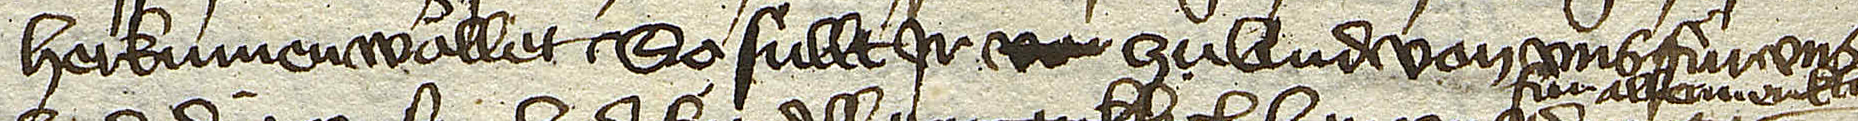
herkumen wöllet / So ſüllt Ir vo cʒu vnd von vns für vns
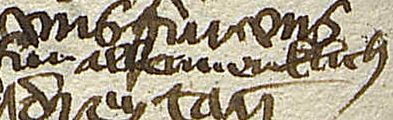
für allmenklich
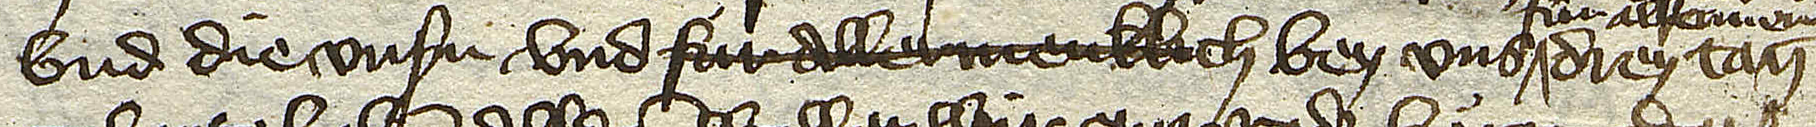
Vnd die vnſ*n / Vnd für Allermenklich bey vns drey tag
